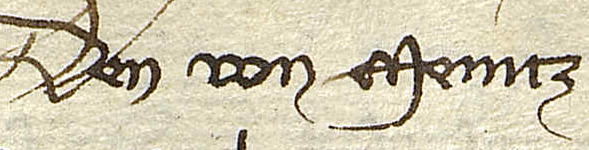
Den von Meincʒ
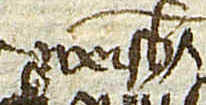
weiſh*
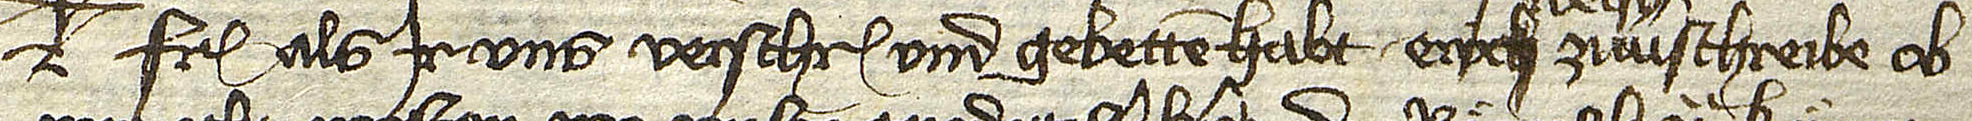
L* fr* als Ir vns verſchr* vnd gebette* habt / ew* ʒuu*ſchreibe ob
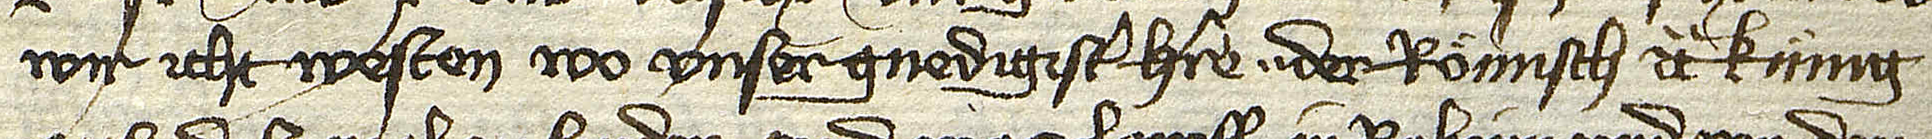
wir icht weſten wo vnſer gnedigiſt* h*re ~ der Römiſch ec* künig
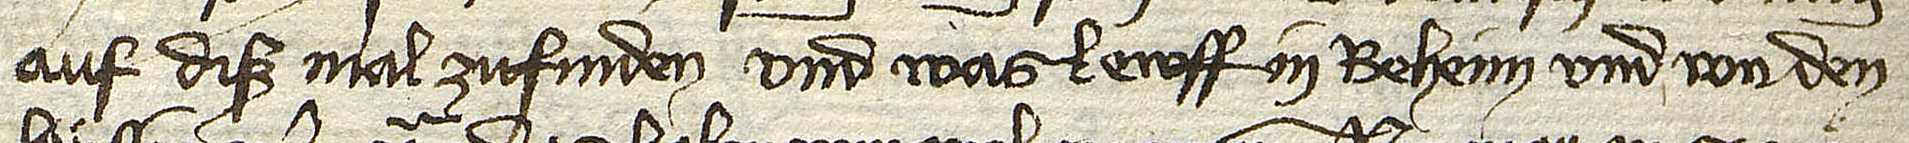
auf diſʒ mal ʒufinden vnd was lewff in Beheim vnd von den
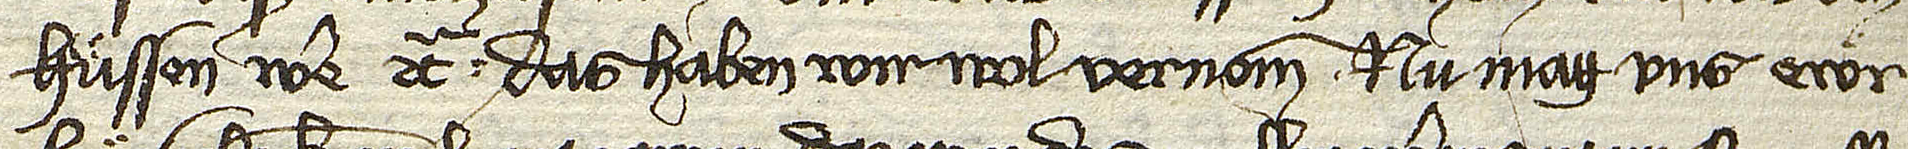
hüſſen we* ec* : das haben wir wol vernom* . Nu mag vns ewr
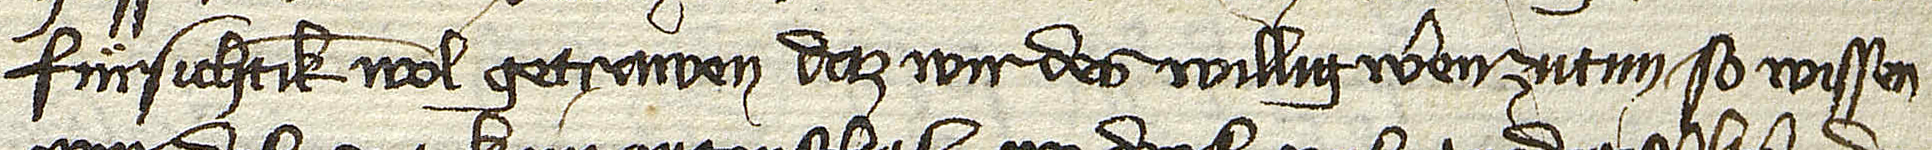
fürſichtik* wol getrawen daʒ wir des willig w*en ʒutun / ſo wiſſen
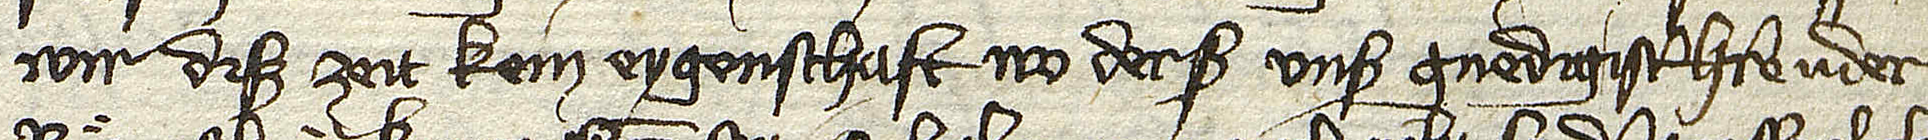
wir diſʒ ʒeit kein eygenſchaft wo derſ* vnſ* gnedigiſt* h*re ~ der
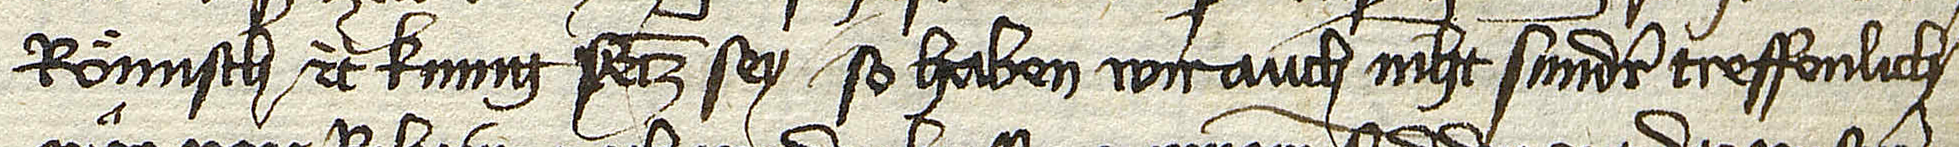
Römiſch ec* kunig yecʒ* ſey / ſo haben wir auch niht ſundr* treffenlich*
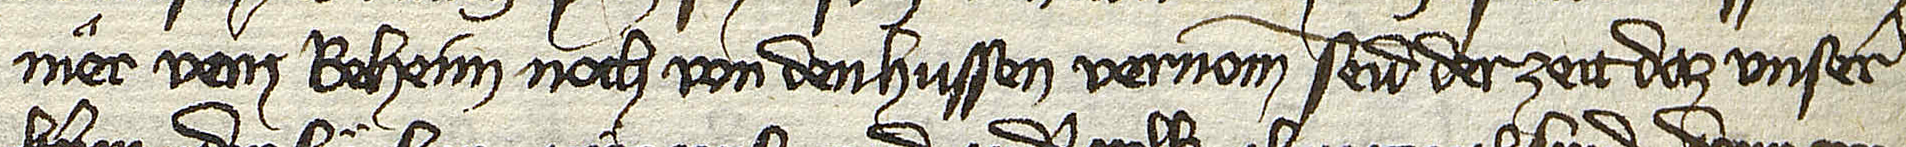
mër von Beheim noch von den huſſen vernom* ſeid der ʒeit daʒ vnſer*
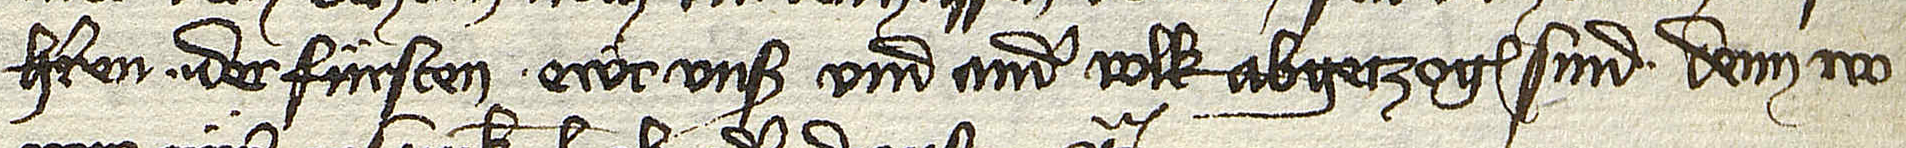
h*ren ~ der fürſten . ewr vnſ* vnd and* volk abgecʒog* ſind . Denn wo
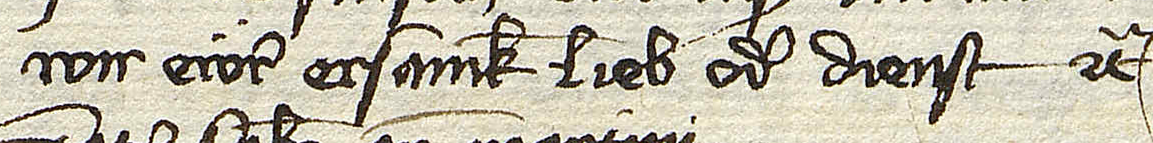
wir ew*r erſamk* lieb od* dienſt ec*
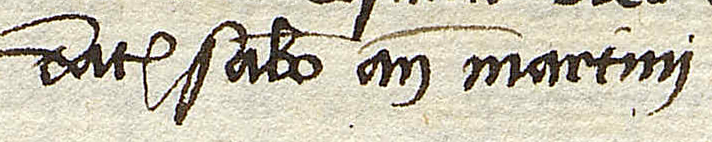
Dat* ſabo* an* martinii
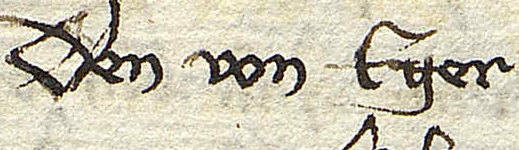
Den von Eger
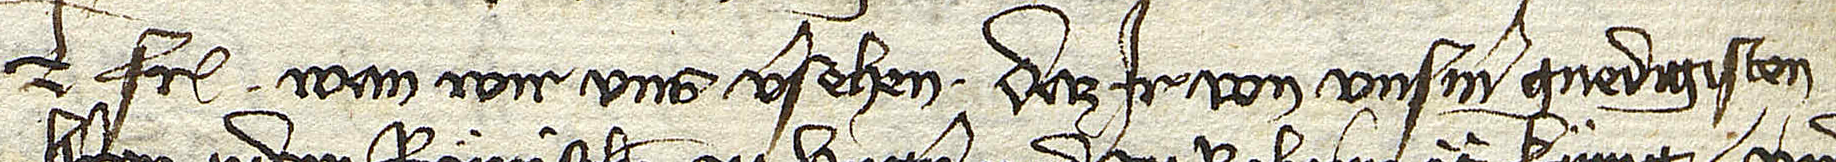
L* fr* . wan wir vns v*ſehen . daʒ Ir von vnſ*m gnedigiſten
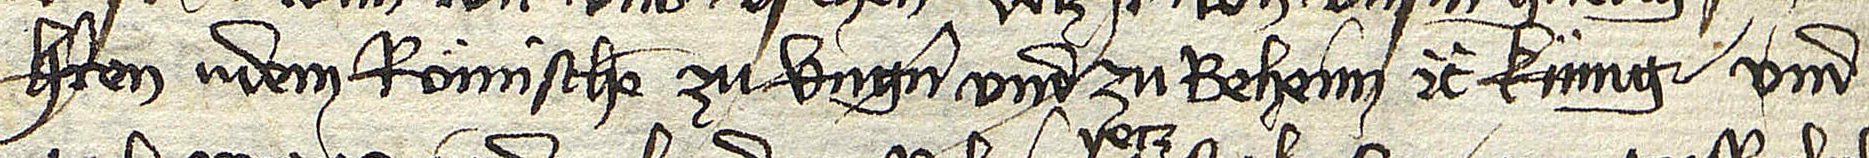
H*ren ~ dem Römiſche* ʒu Vng*n vnd ʒu Beheim ec* künig* vnd
